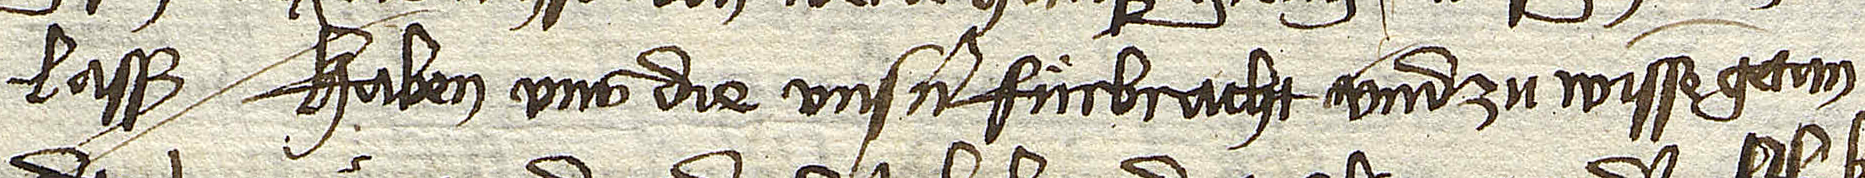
laſſ* / haben vns die vnſn* fürbracht vnd ʒu wiſſe* getan
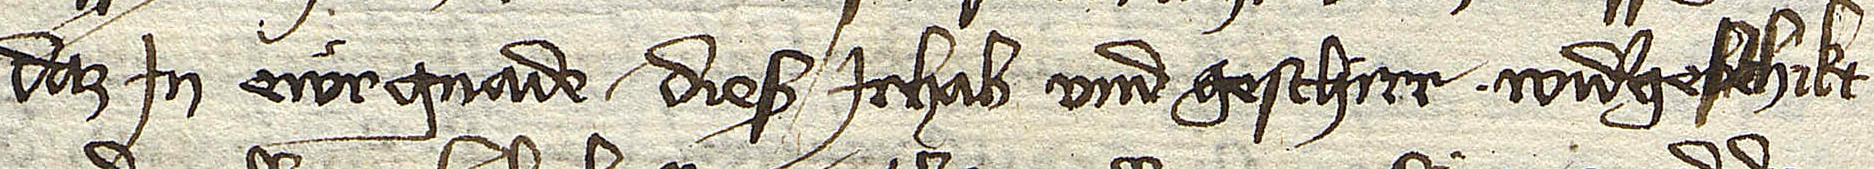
daʒ In ewr gnade / dieſ* Ir hab vnd geſchirr . wid* geſchikt
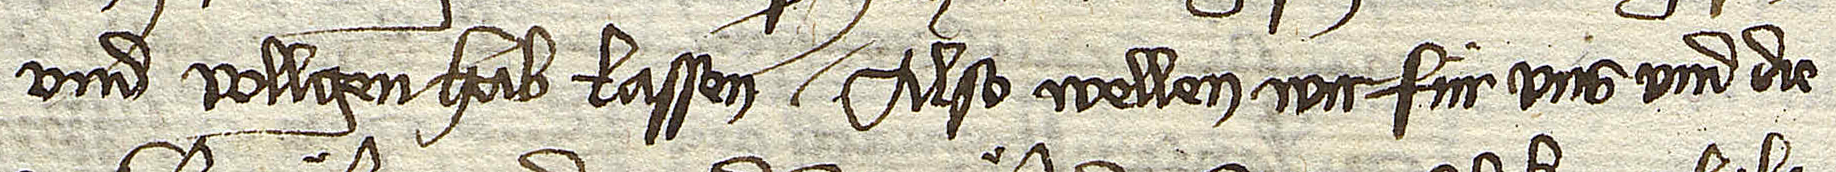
vnd vollgen hab laſſen / Alſo wellen wir für vns vnd die
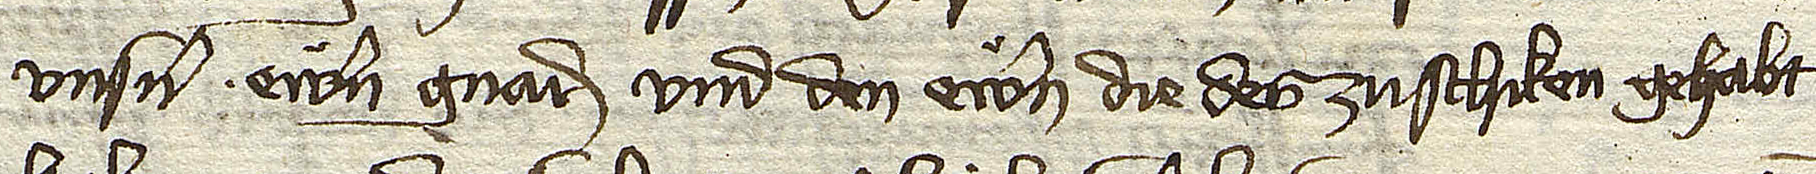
vnſn* . ew*n gnad* vnd den ew*n die des ʒuſchicken gehabt
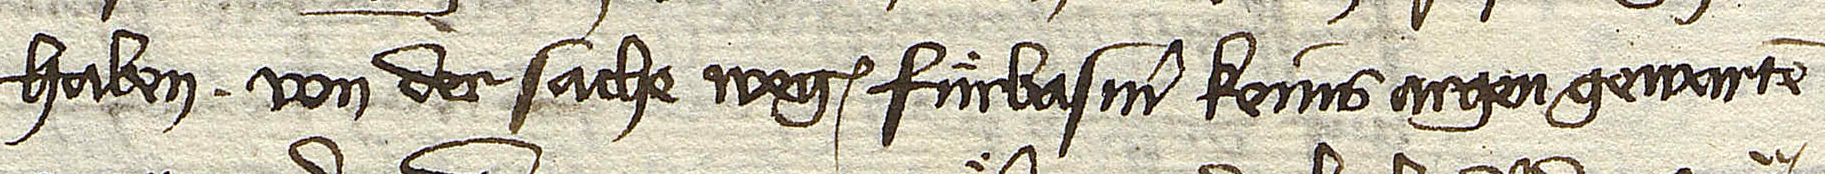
haben . von der ſache weg* fürbaſm* keins argen gewarte*
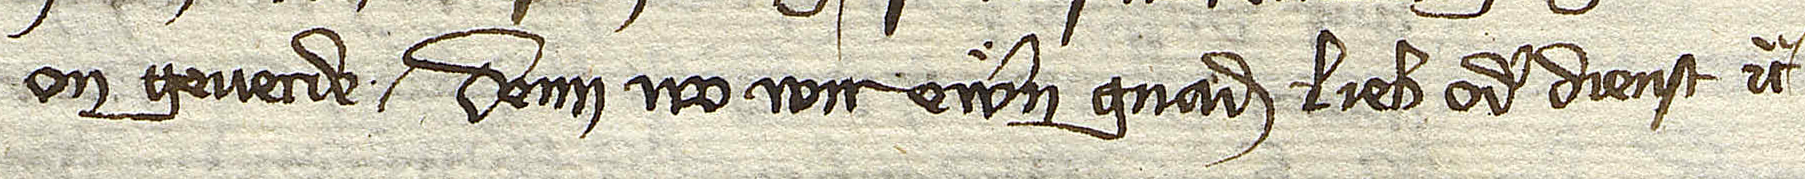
on geuerde / Denn wo wir ew*n gnad* lieb od* dienſt ec*
